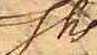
Jhs̄
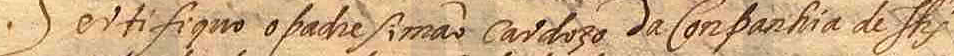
Sertifiquo o padre simão cardozo da Conpanhia de Jhs̄
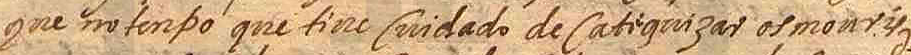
que no tenpo que tiue Cuidado de Catequizar os mouris
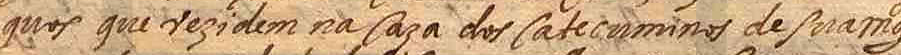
quos que rezidem na Caza dos Catecumenos de sua mgde
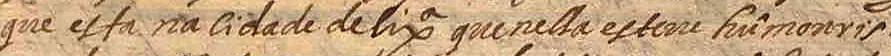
que esta na cidade de lixa que nella esteue hū mouris
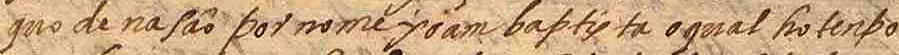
quo de nasão por nome yoam baptista o qual ho tenpo
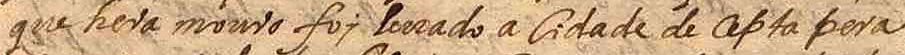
que hera mouro foy leuado a Cidade de Cepta pera
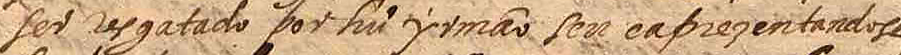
ser resgatado por hū yrmão seu e aprezentandose
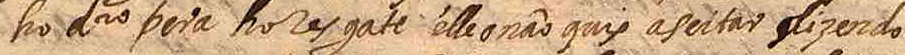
ho dro pera ho resgate elle o não quis aseitar dizendo
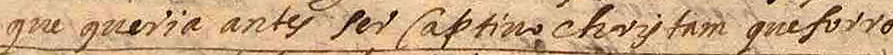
que queria antes ser Captiuo christam que forro
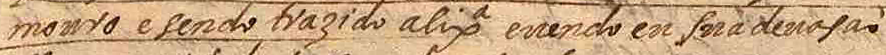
mouro e sendo trazido a lixa e uendo eu sua deuasaõ
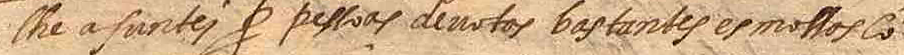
lhe ajuntei ꝓ pessoas deuotas bastantes esmollas cō
